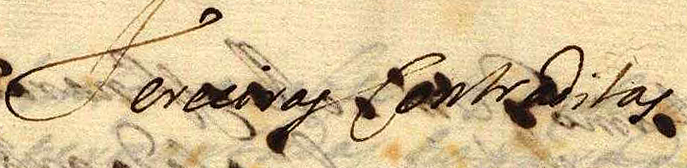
Terceiras Contraditas
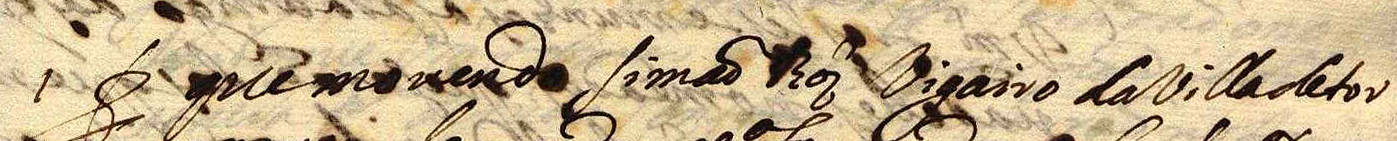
1 ꝓ que mouendo simaõ Roz̄ Vigairo da Villa de tor
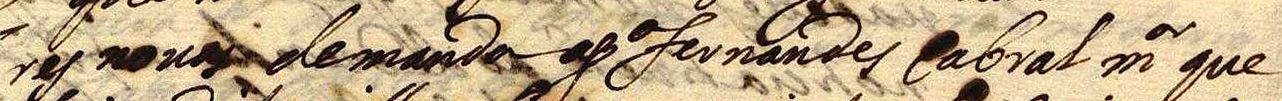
res nouas demanda a po fernandes cabral mor que
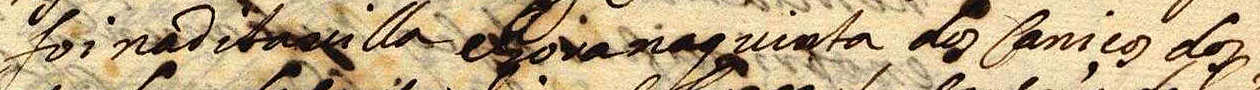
foi na dita uilla e hora na quinta dos Caniços dos
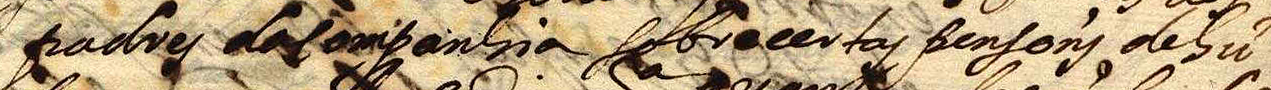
padres da companhia sobre certas penson̄s de hū
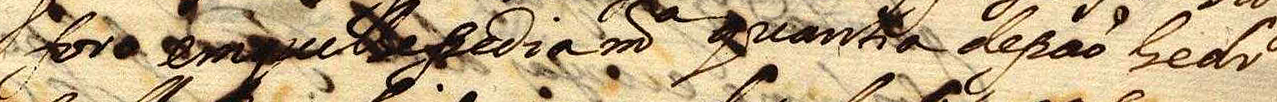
foro em que lhe pedia mta quantia de paõ he dro
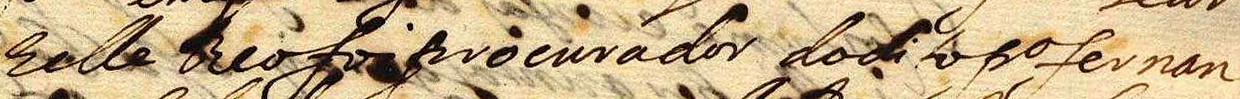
E elle Reo foi procurador do dito po fernan
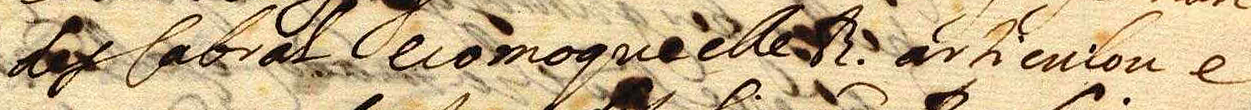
des Cabral e como que elle R. articulou e
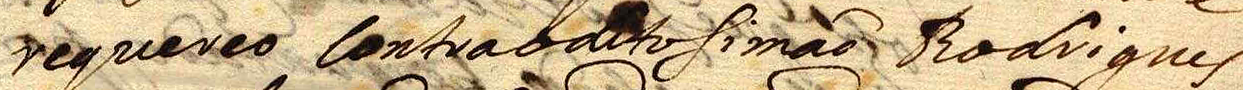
requereo Contra o dito simaõ Rodrigues
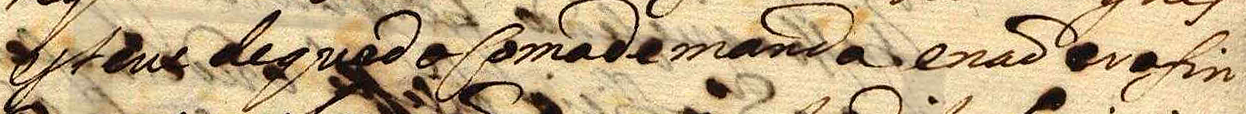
esteue de quedo Com a demanda e naõ era fin
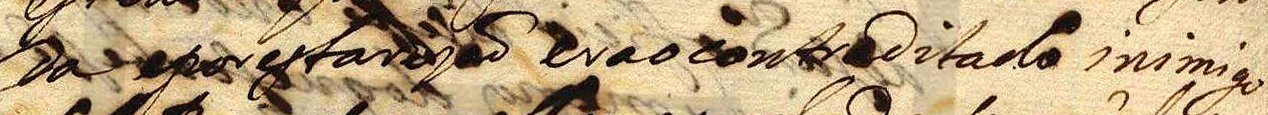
da e por esta rezaõ era o contraditado inimigo
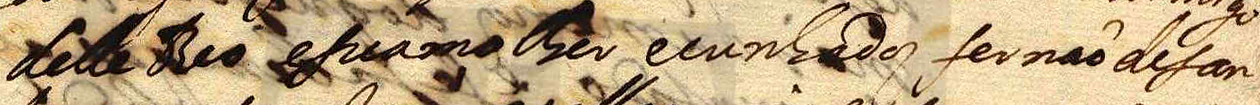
delle Reo e sua molher e cunhados fernaõ de san
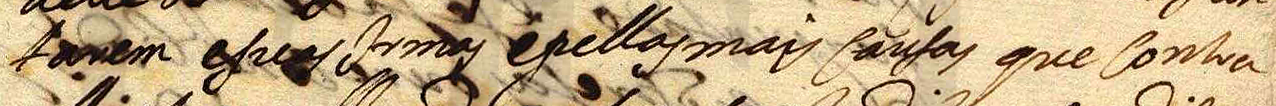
tarem e suas Jrmãs e pellas mais Causas que Contra
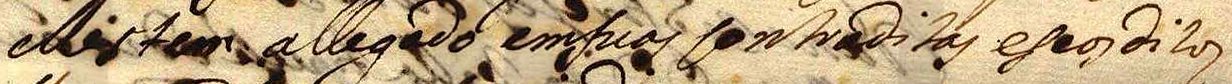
elles tem allegado em suas Contraditas e seos ditos
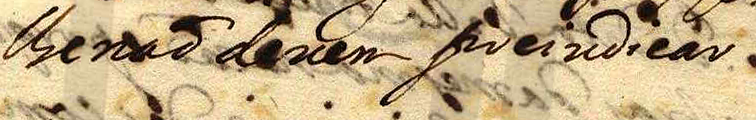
lhe naõ deuem preiudicar
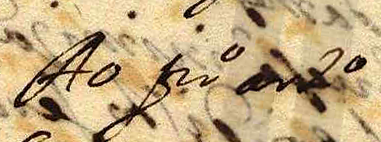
Ao pro arto
